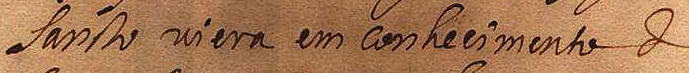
Sancto uiera em conhecimento de
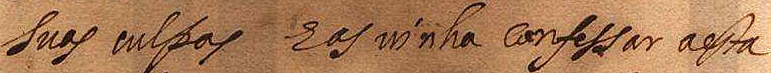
suas culpas E as uinha confessar a esta
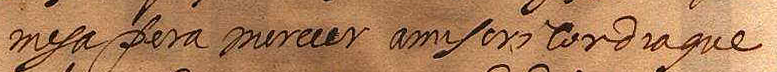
mesa pera merecer a misericordia que
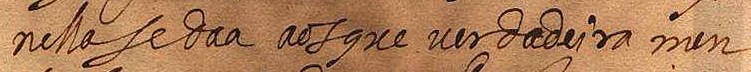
nella se daa aos que uerdadeiramen
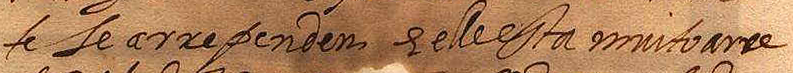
te se arrependem E elle esta muito arre
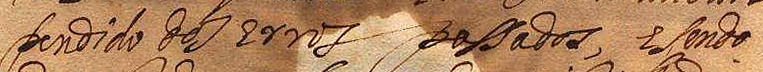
pendido dos Erros passados, E sendo
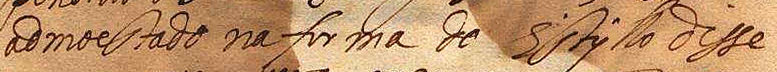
admoestado na forma do Estyllo disse
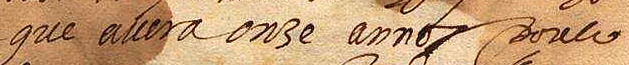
que auera onze annos pouco
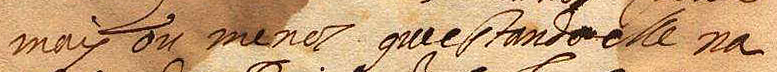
mais ou menos que estando elle na
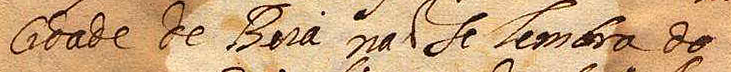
Cidade de Beia naõ se lembra do
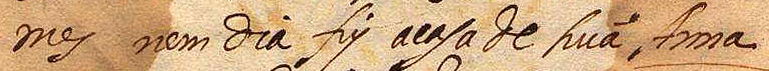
mes nem dia foy a casa de huā Anna
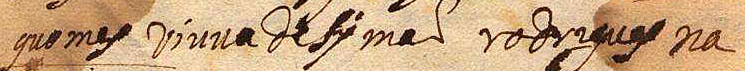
guomes viuua de symaõ rodrigues na
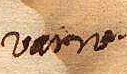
varro
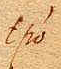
tpō
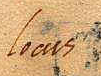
locus
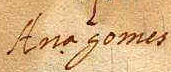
Ana gomes
